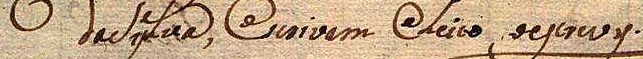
da Sylva, escrivam eLeito, o escrevy.
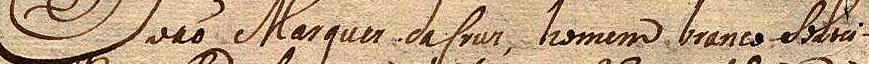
Joaõ Marquez da Cruz, homem branco SoLtei
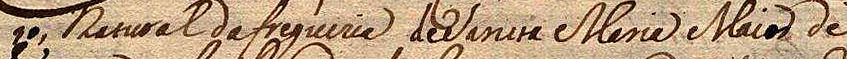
ro, Natural da freguezia de Sancta Maria Maior de
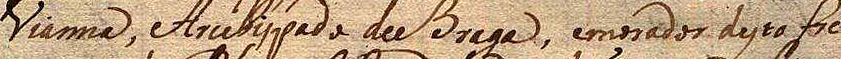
Vianna, Arcebispado de Braga, e morador desta fre
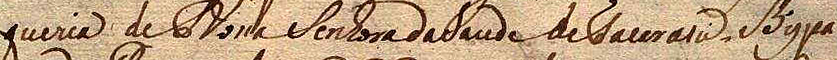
guezia de Nossa Senhora da Saude de Tacaratú, Bispa
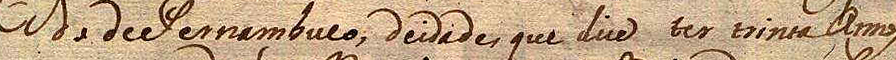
do de Pernambuco, de idade, que dice ter trinta annos
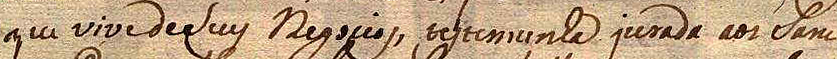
que vive de seus Negocios, testemunha jurada aos Sanc
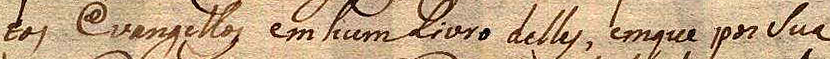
tos evangelhos em hum Livro delles, em que poz sua
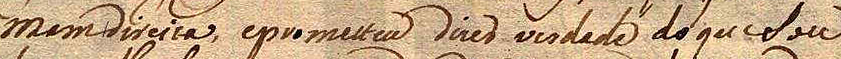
mam direita, e prometteu dizer verdade do que Sou
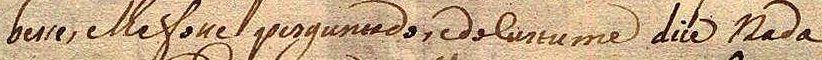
besse, e lhe fosse perguntado, e do Custume dice Nada
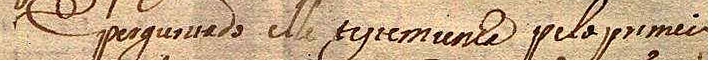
E perguntado elle testemunha pelo primei
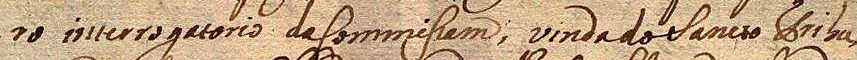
ro interrogatorio da Commissam, vinda do Sancto Tribu
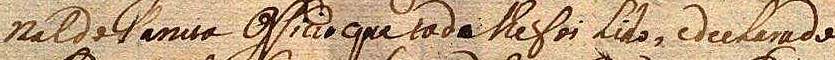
nal do Sancto Officio que todo lhe foi Lido, e decLarado,
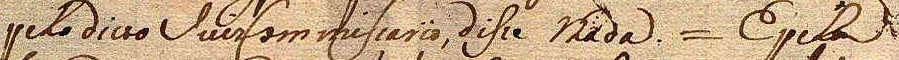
pelo dicto Iuiz Commissario, disse Nada. = E pela
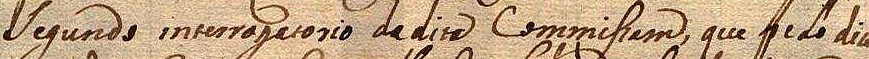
segundo interrogatorio da dita Commissam, que peLo dic
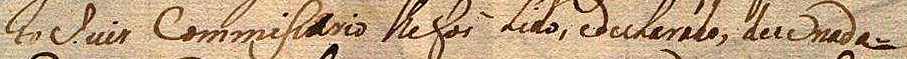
to Iuiz Commissario lhe foi Lido, e decLarado, dece nada
